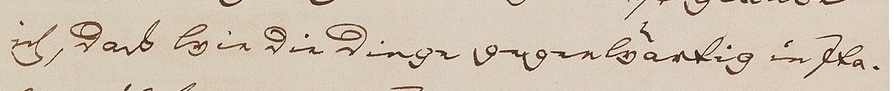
ich, daß wie die Dinge gegenwärtig in Ita-
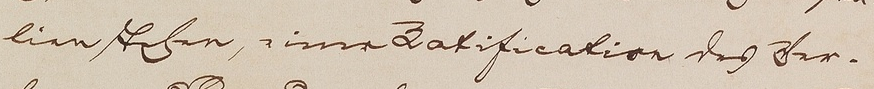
lien stehen, einer Ratification des Ver-
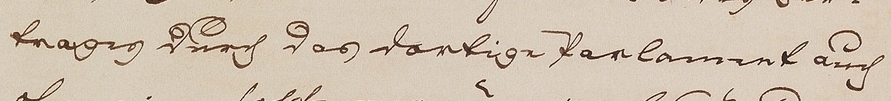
trages durch das dortige Parlament auch
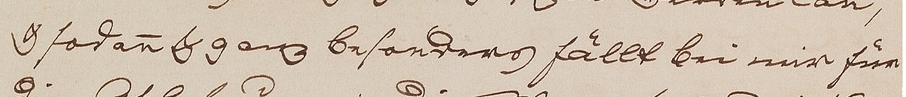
& sodann & ganz besonders fällt bei mir für
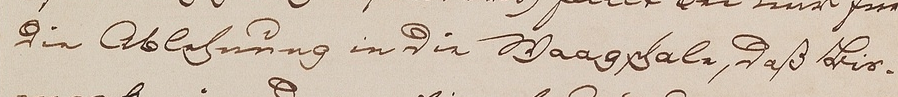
die Ablehnung in die Waagschale, daß Bis-
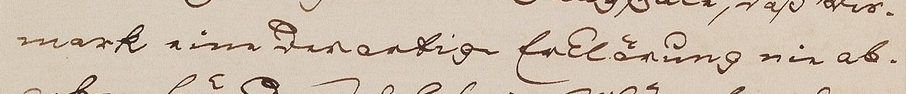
mark eine derartige Erklärung nie ab-
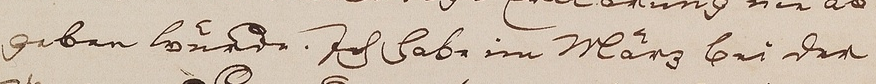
geben würde. Ich habe im März bei der
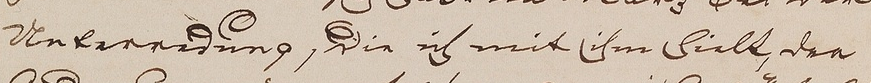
Unterredung, die ich mit ihm hielt, den
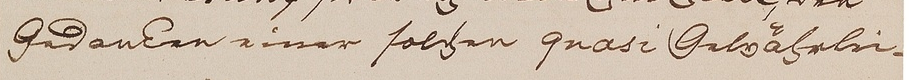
Gedanken einer solchen quasi Gewährlei-
